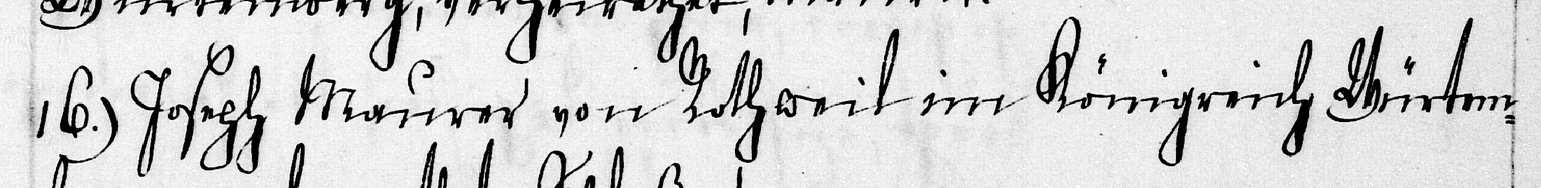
16.) Joseph Maurer von Rothweil im Königreich Würtem¬
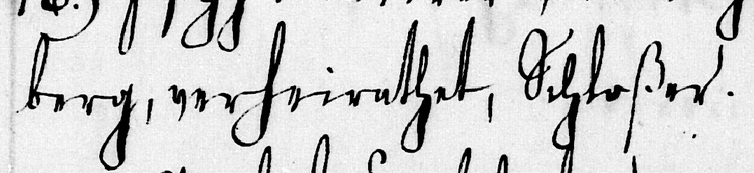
berg, verheirathet, Schloßer.
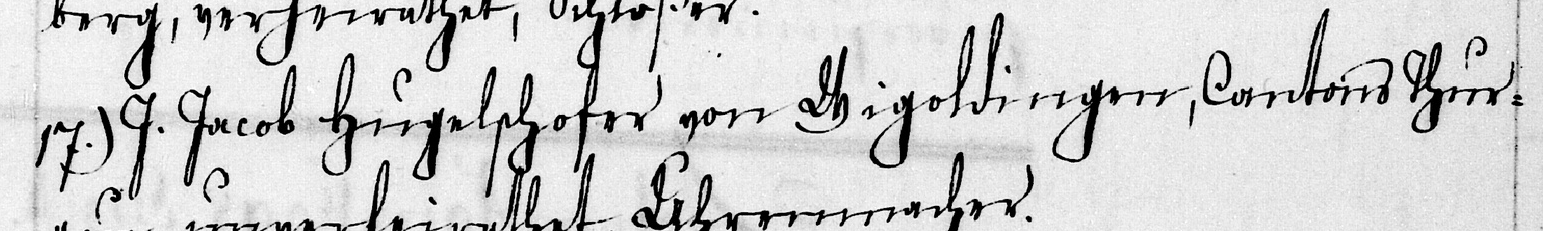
17.) J. Jacob Hugelschofer von Wigoldingen, Cantons Thur¬
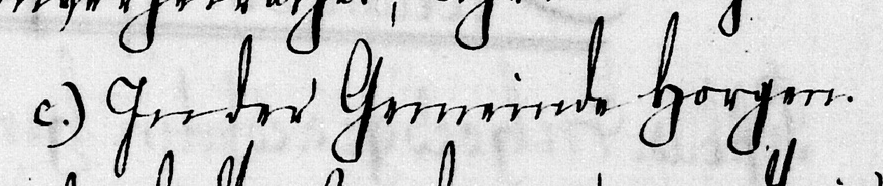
c.) In der Gemeinde Horgen.
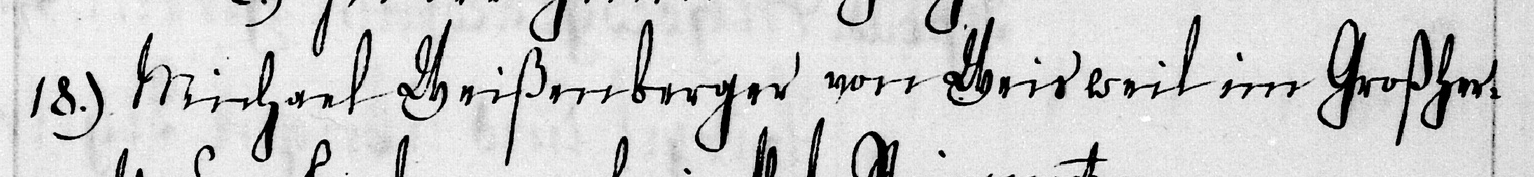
18.) Michael Weißenberger von Weisweil im Großher¬
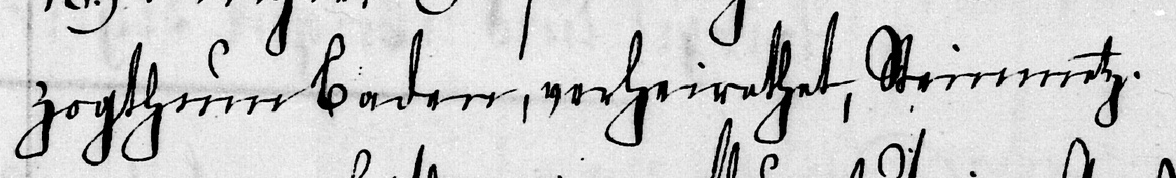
zogthum Baden, verheirathet, Steinmetz.
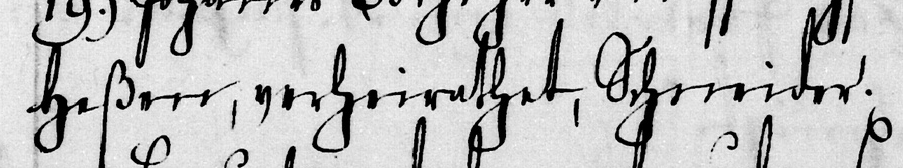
Heßen, verheirathet, Schneider.
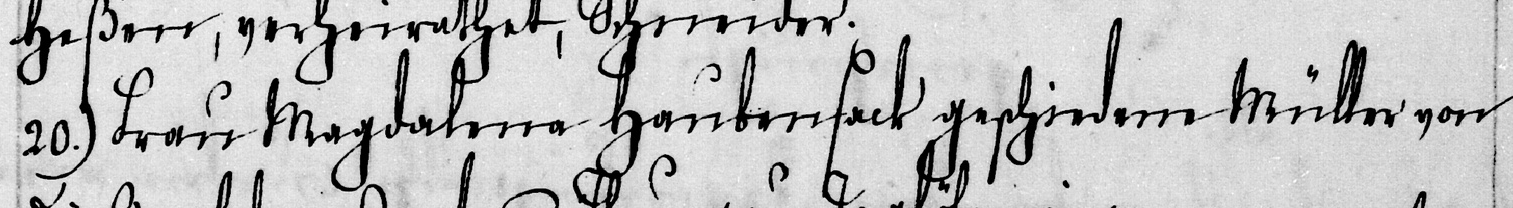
20.) Frau Magdalena Haubensack geschiedene Müller von
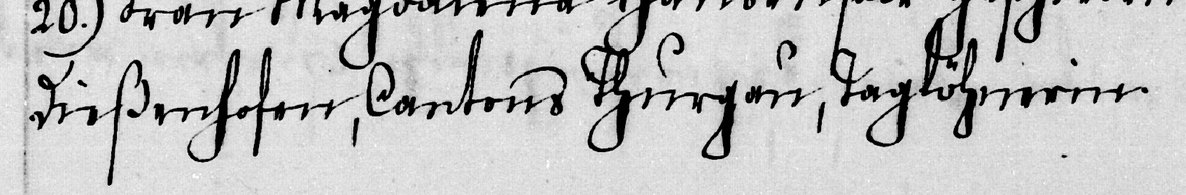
Dießenhofen, Cantons Thurgau, Taglöhnerin.
